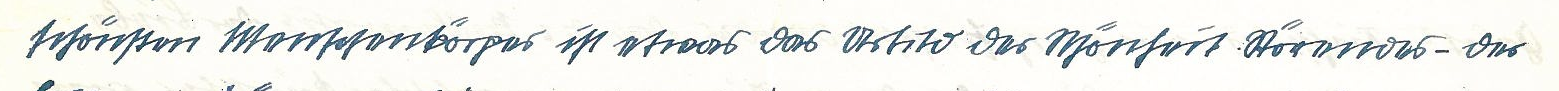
schönsten Menschenkörper ist etwas das Urbild der Schönheit Störendes – der
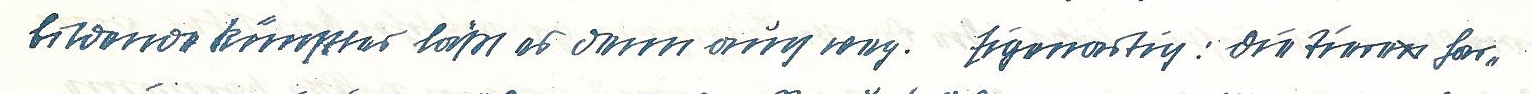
bildende Künstler läßt es denn auch weg. Eigenartig: die Tieren har¬
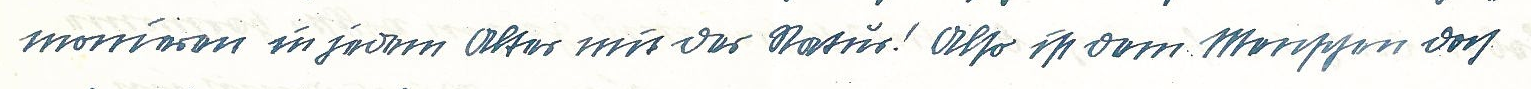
monieren in jedem Alter mit der Natur! Also ist dem Menschen doch
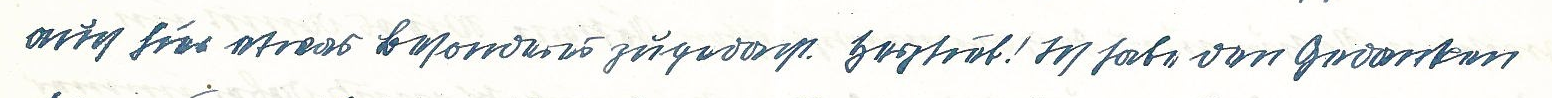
auch hier etwas Besonderes zugedacht. Herzlieb! Ich habe den Gedanken
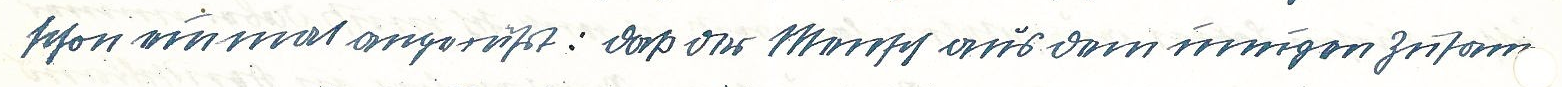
schon einmal angerührt: daß der Mensch aus dem innigen Zusam¬
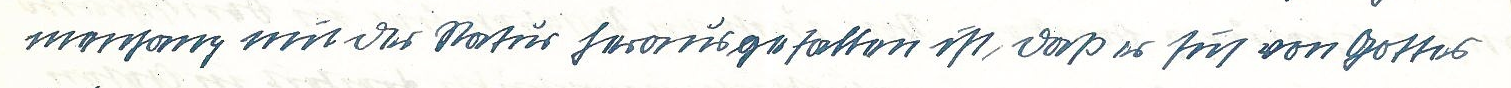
menhang mit der Natur herausgefallen ist, daß er sich von Gottes
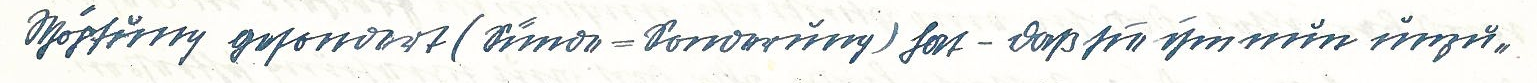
Schöpfung gesondert (Sünde = Sonderung) hat – daß sie ihn nun unzu¬
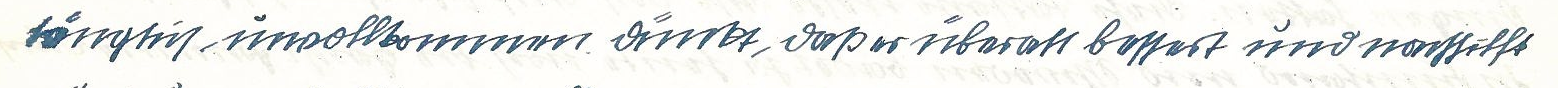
länglich unvollkommen, dünkt, daß er überall bessert und nachhilft
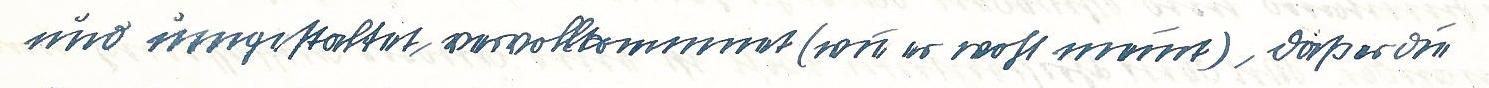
und umgestaltet, vervollkommnet (wie er wohl meint), daß er die
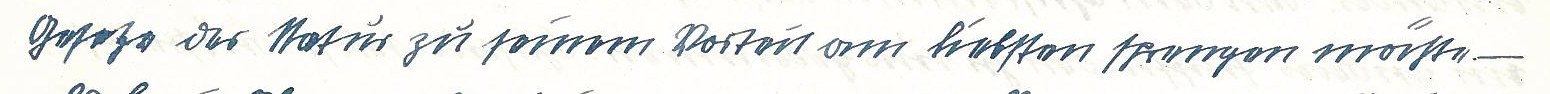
Gesetze der Natur zu seinem Vorteil am liebsten sprengen möchte –
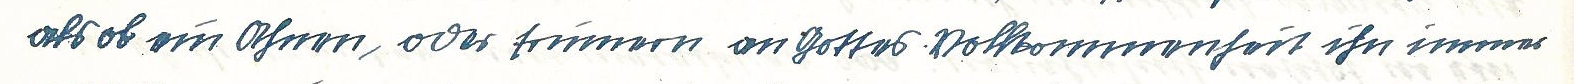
als ob ein Ahnen, oder Erinnern an Gottes Vollkommenheit ihn immer
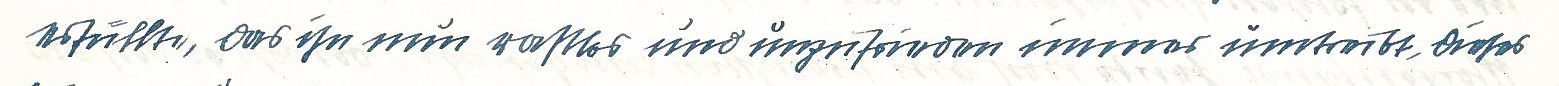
erfüllte, das ihn nun rastlos und unzufrieden immer umtreibt, dieses
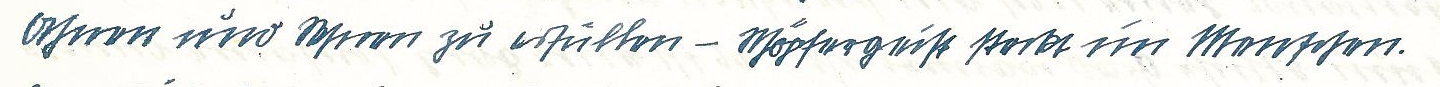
Ahnen und Sehnen zu erfüllen – Schöpfergeist steckt im Menschen.
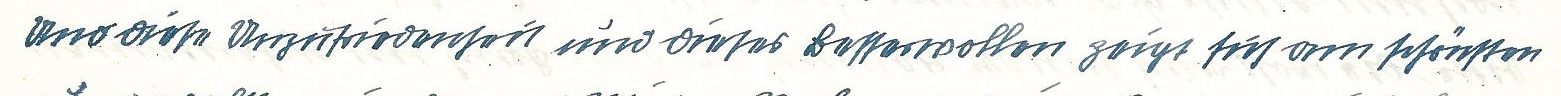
Und diese Unzufriedenheit und dieses Besserwollen zeigt sich am schönsten
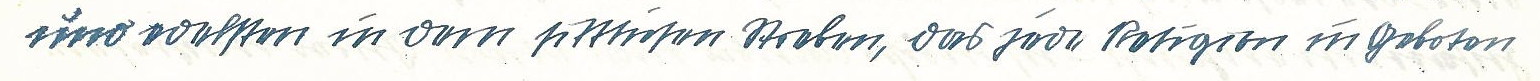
und edelsten in dem sittlichen Streben, das jede Religion in Geboten
